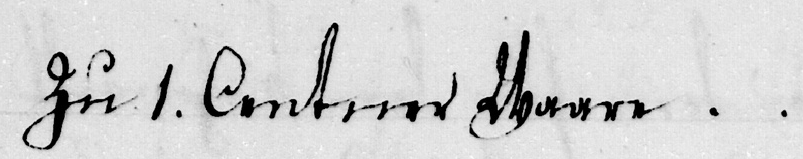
Zu 1. Centner Waare .
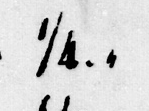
10.
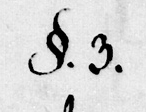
§. 3.
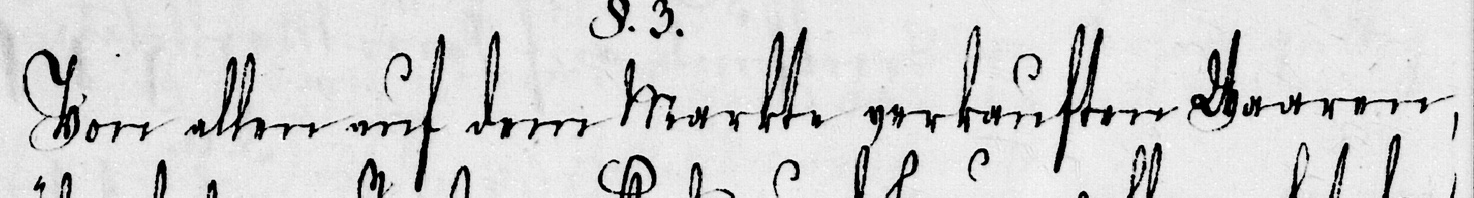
Von allen auf dem Markte verkauften Waaren,
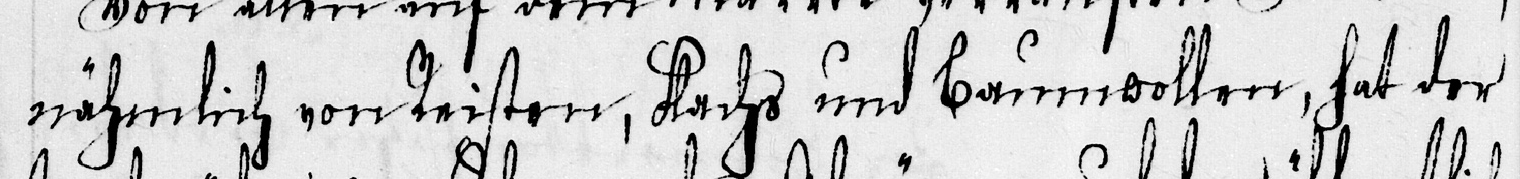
nähmlich von Reisten, Flachs und Baumwollen, hat der
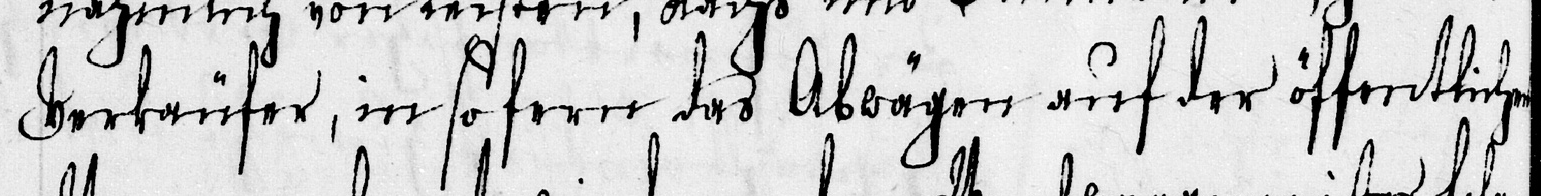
Verkäufer, insofern das Abwägen auf der öffentlic¬
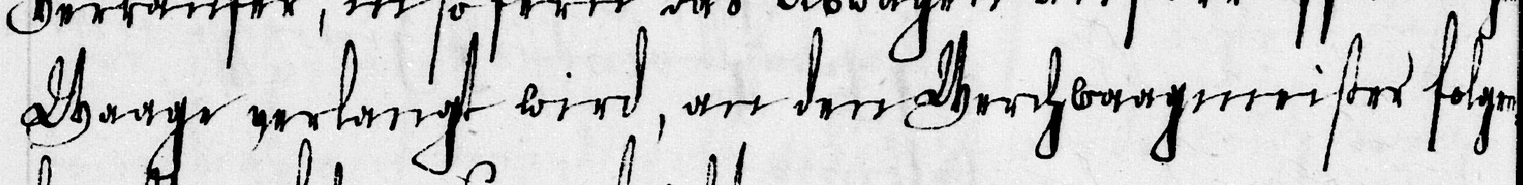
Waage verlangt wird, an den Werchwaagmeister folg¬
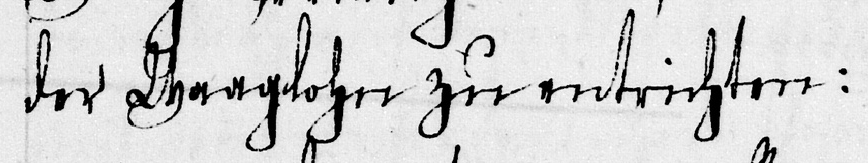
der Waaglohn zu entrichten:
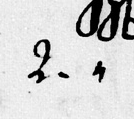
. .
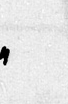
en¬
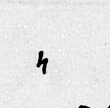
4.
